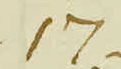17
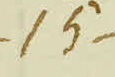15
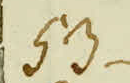53
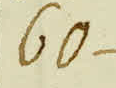60
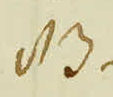83
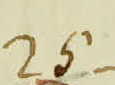25
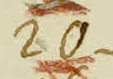20
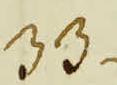33
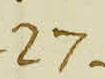27
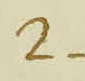2
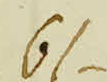61
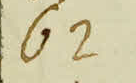62
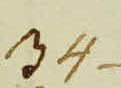34
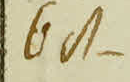68
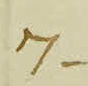7
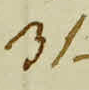31
